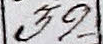39
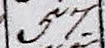57
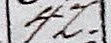42
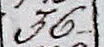36
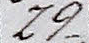29
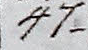47
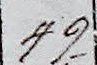49
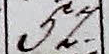52
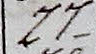27
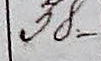38
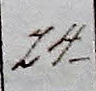24
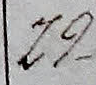29
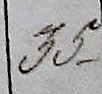35
